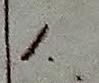1.
